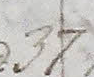37
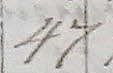47
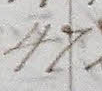47
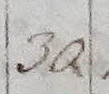30
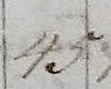45
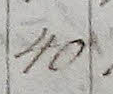40
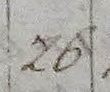26
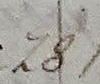28
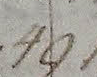49
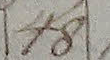48
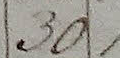30
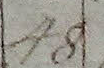48
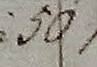50
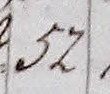52
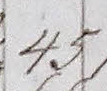45
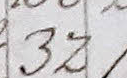32
